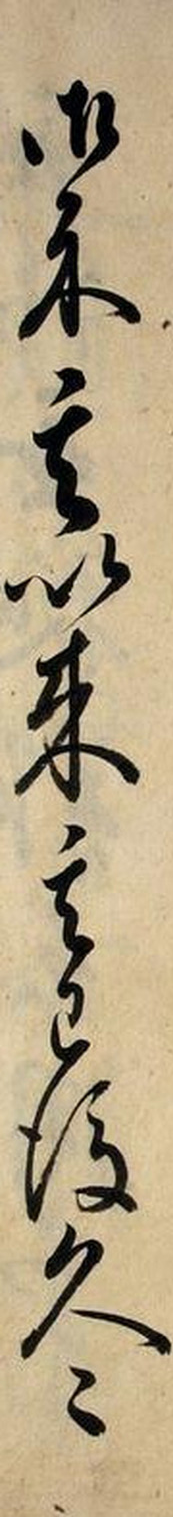御示其以来其已後久々
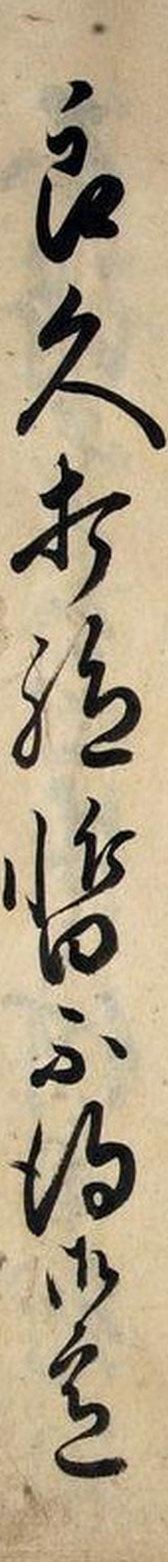良久打絶暫不得御意

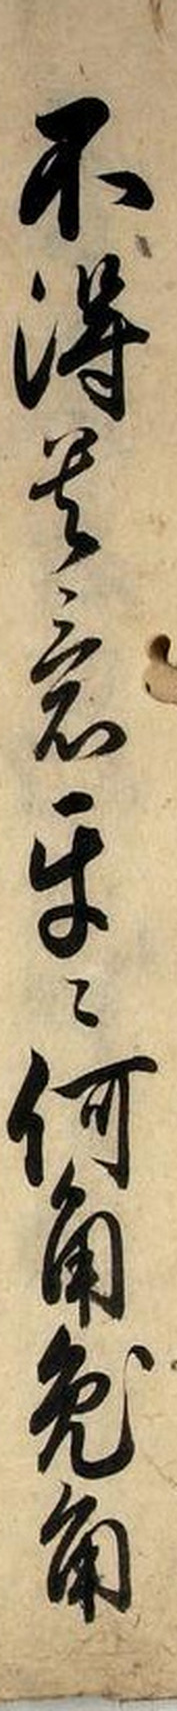不得貴意互ニ何角兎角
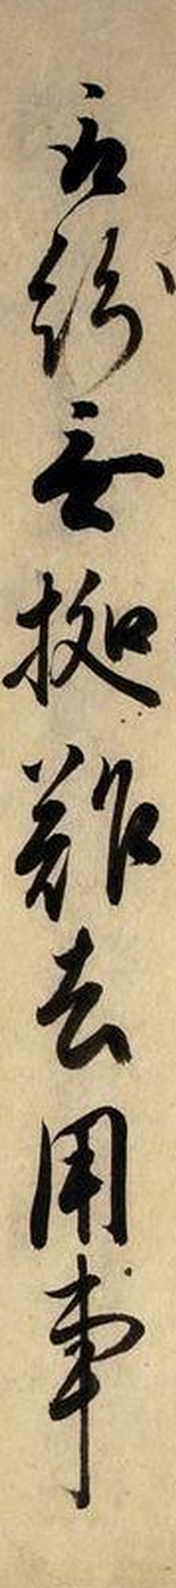取紛無拠難去用事
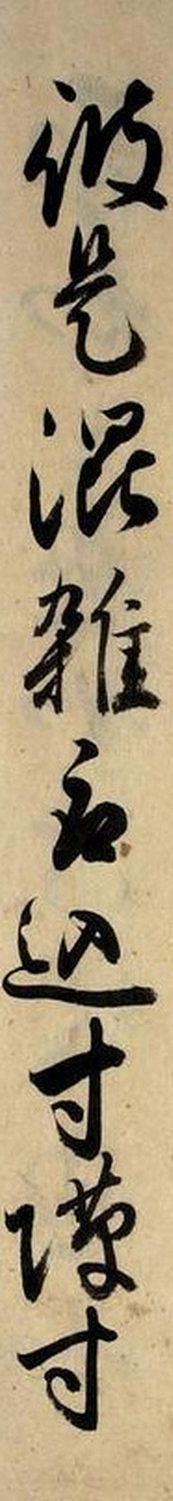彼是混雑取込寸隙寸
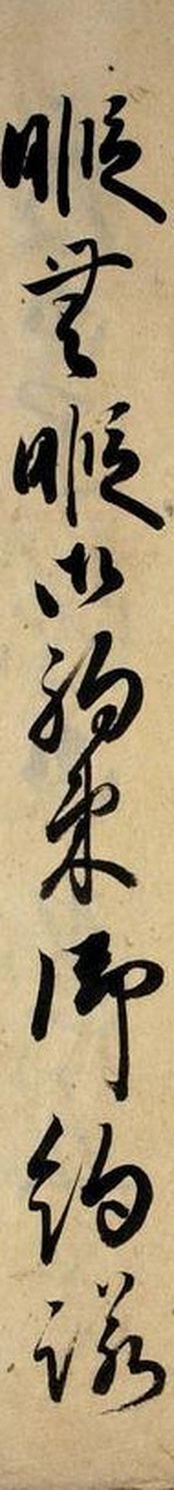暇無暇御約束御約諾
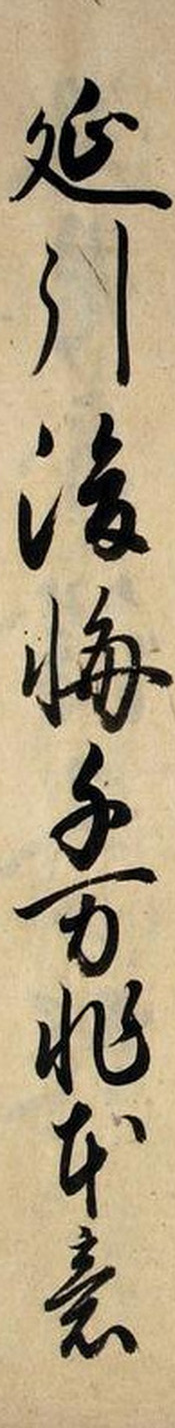延引後悔千万非本意
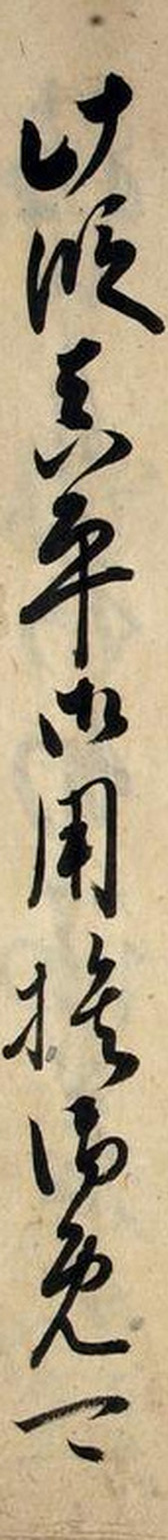此段真平御用捨御免可

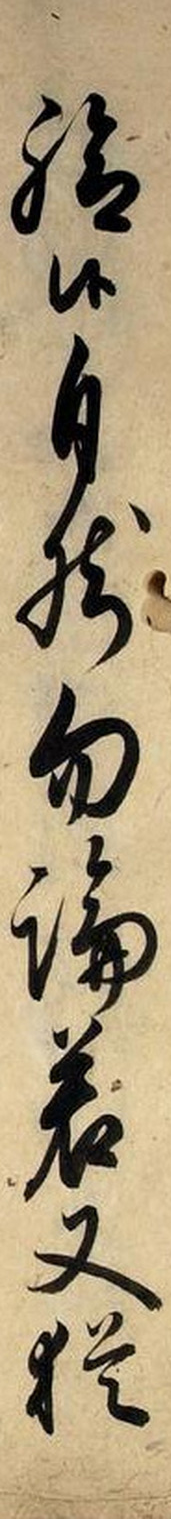給候自然勿論若又猶
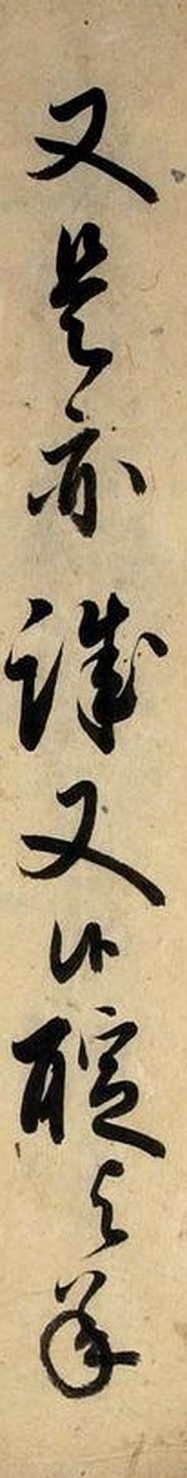又是亦誠又候聢与承
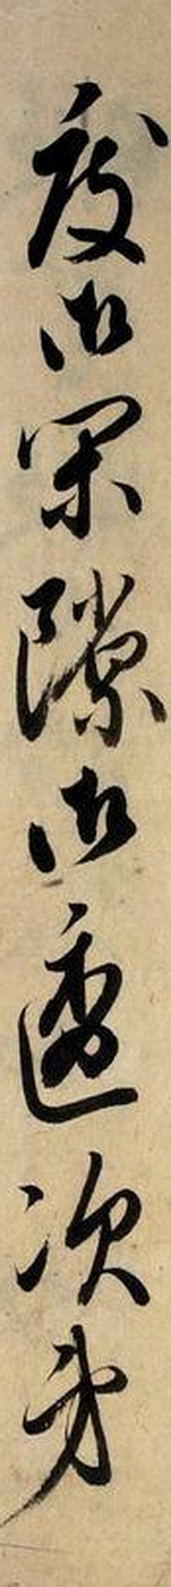度御閑隙御透次第
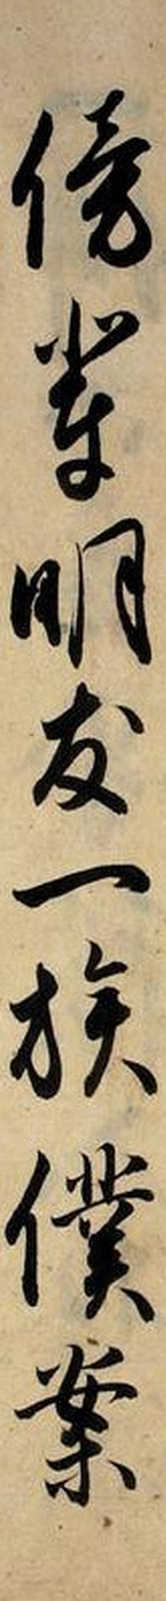傍輩朋友一族僕案
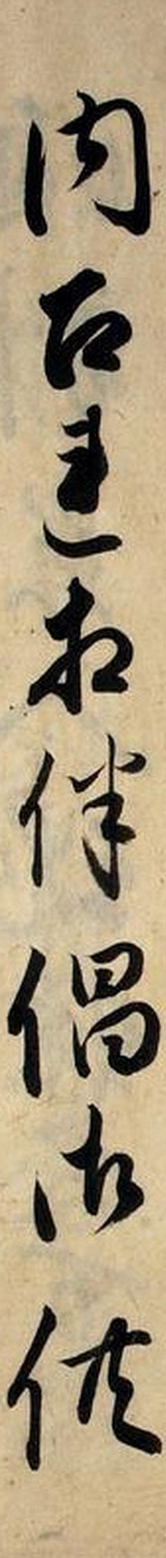内召連相伴倡御供
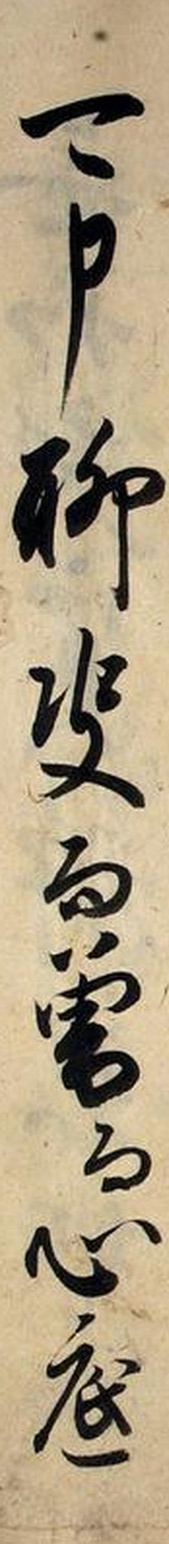可申聊決而曽而心底

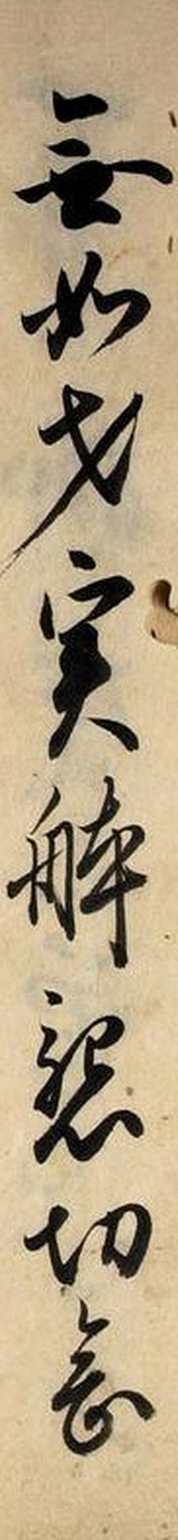無如才実体懇切念
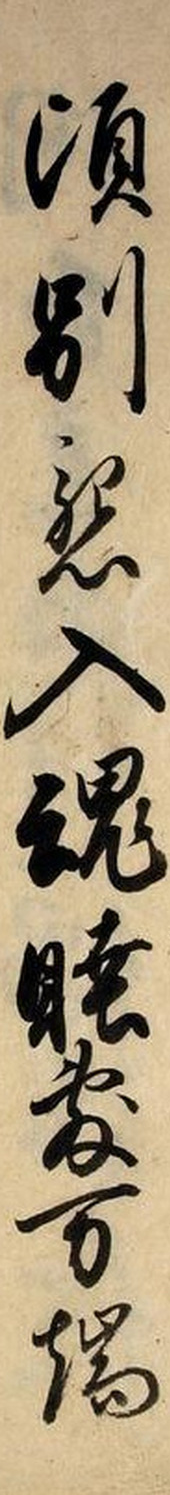頃別懇入魂睦敷万端
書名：消息千字文（往来物、手習手本）
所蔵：福井県文書館 Fukui Prefectural Archives
